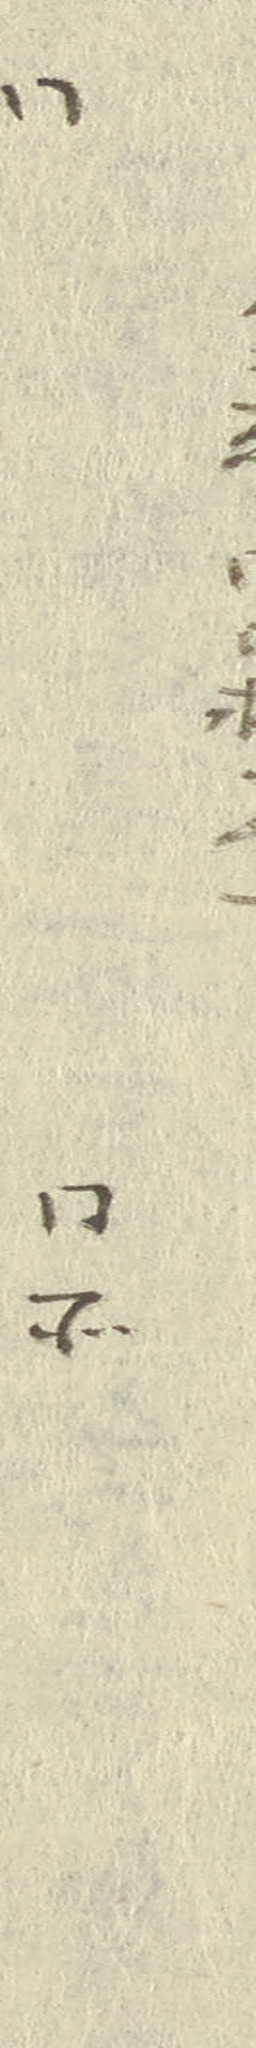同同所
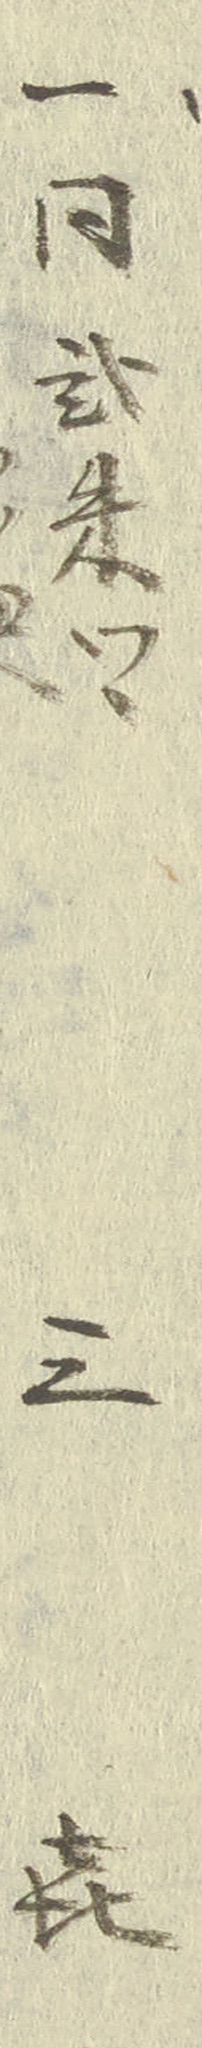一同弐朱ツヽ三㐂
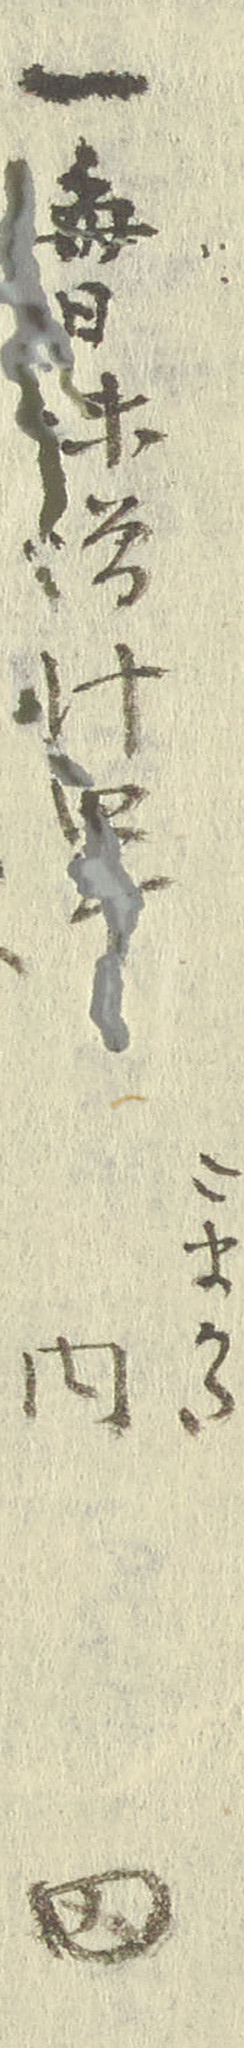一毎日味噌汁四斗内田
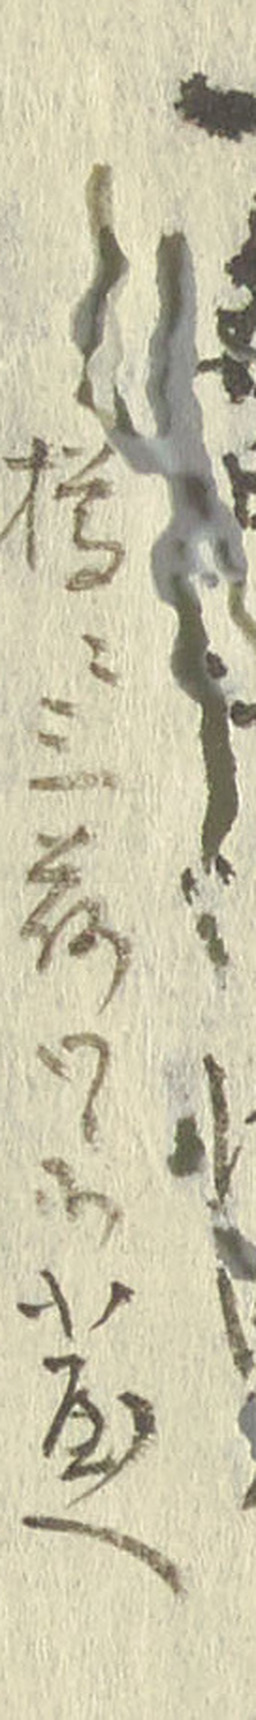樽ニ三荷ツヽ御小屋へ
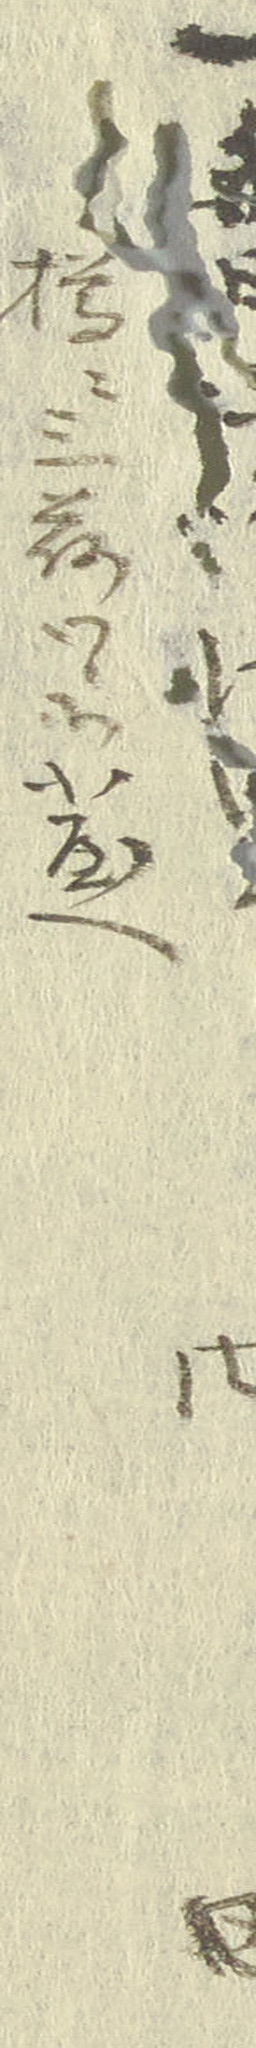樽ニ三荷ツヽ御小屋へ
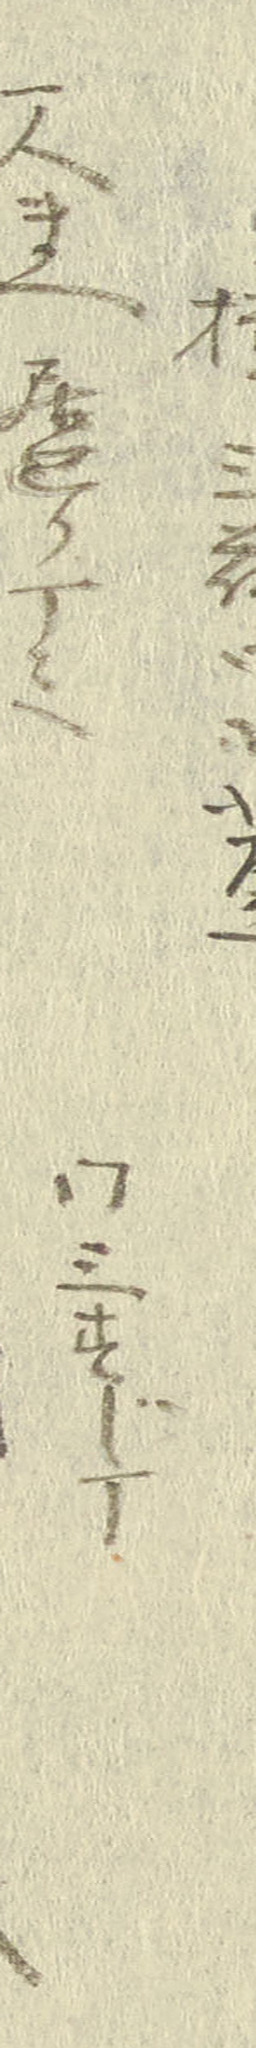一人まへ居廻り丁〻へ同三すじ丁
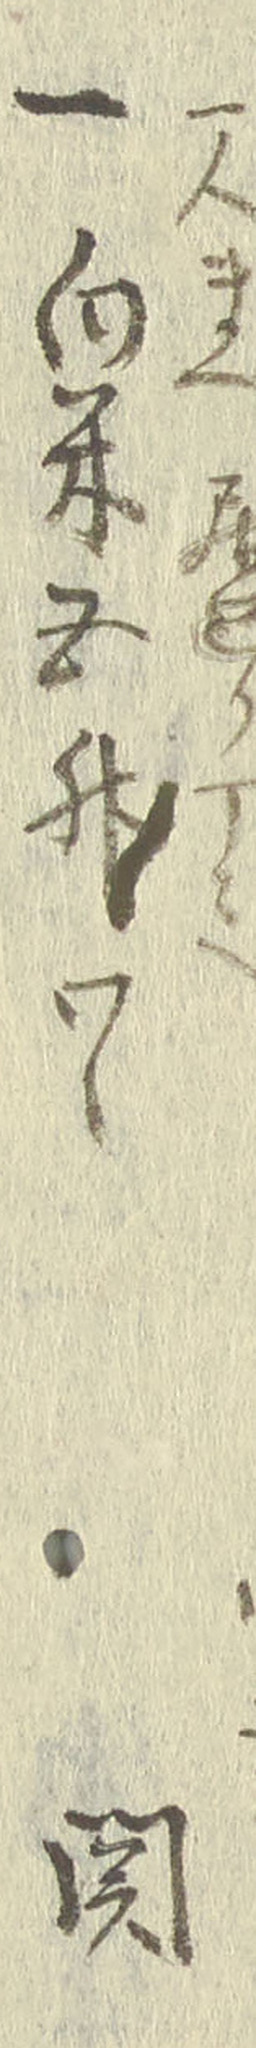一白米五升ツヽ関氏
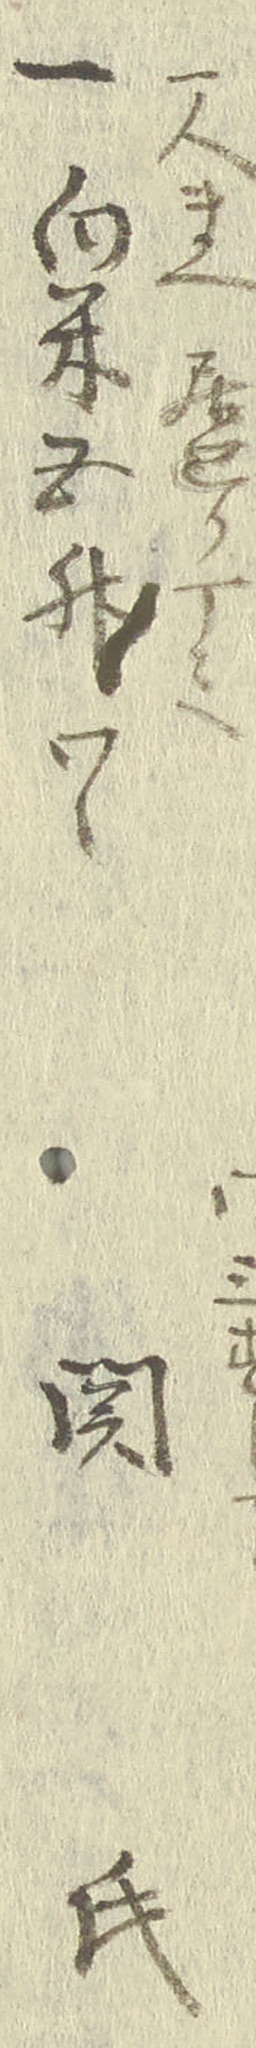一白米五升ツヽ関氏
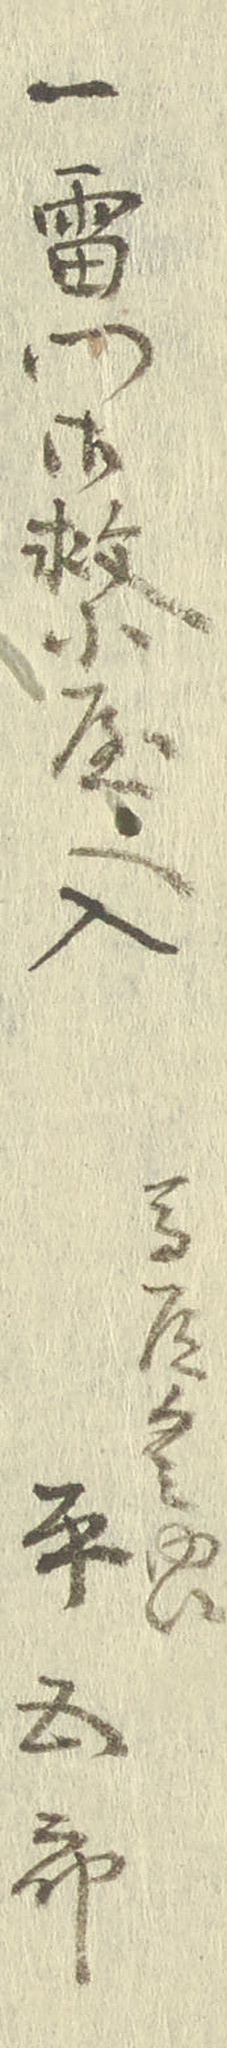一雷門御救小屋へ入平五郎
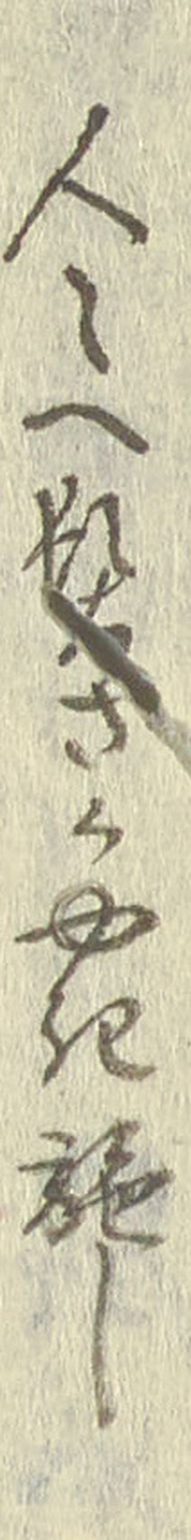人〻へ髪さかやき施し
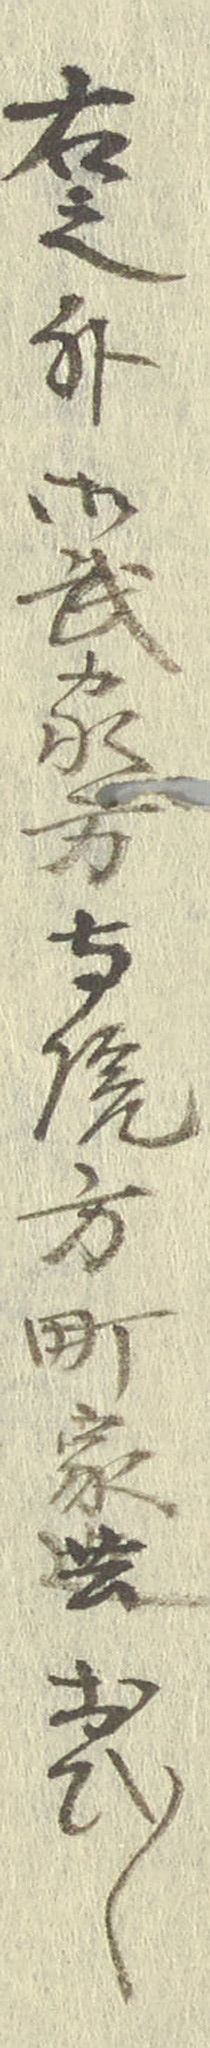右之外御武家方寺院方町家共おい〳〵
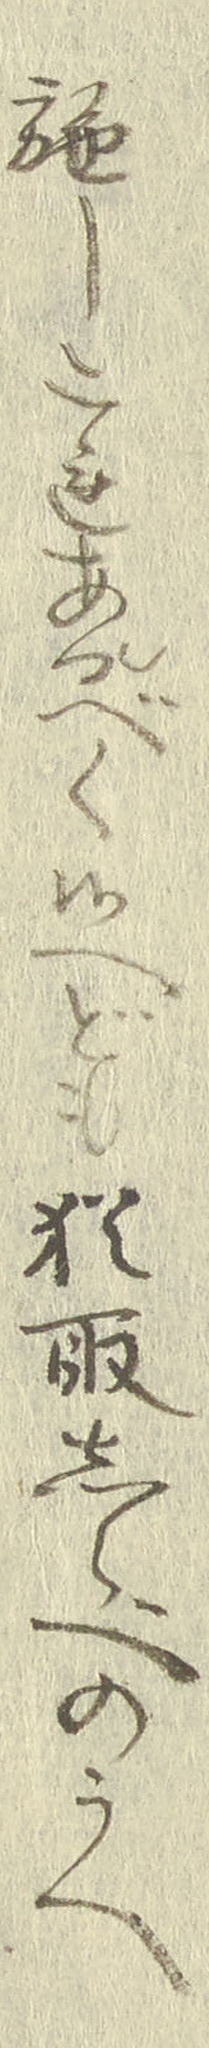施しこれあるべく候へども猶取しらべのうへ
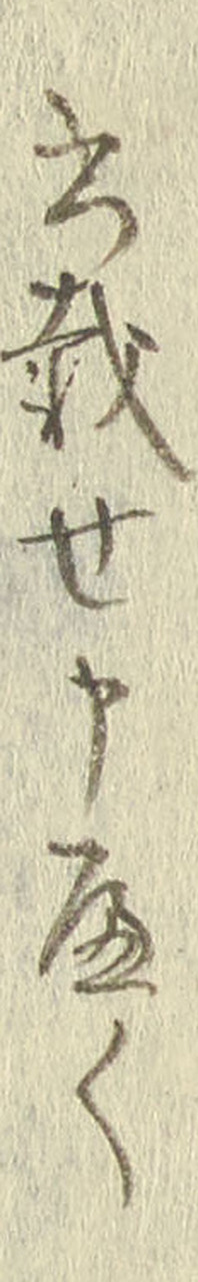書載せ申へく

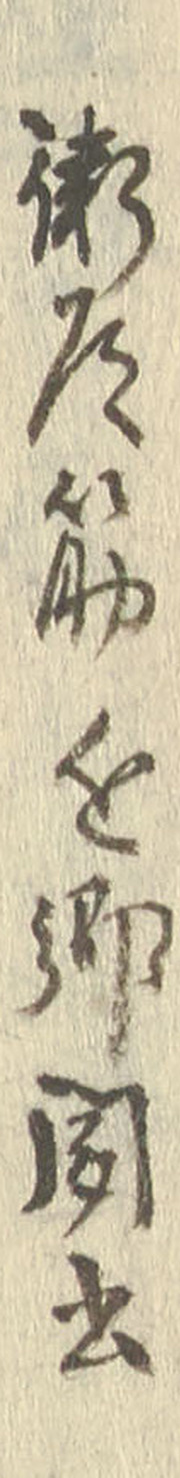街道筋近郷聞書
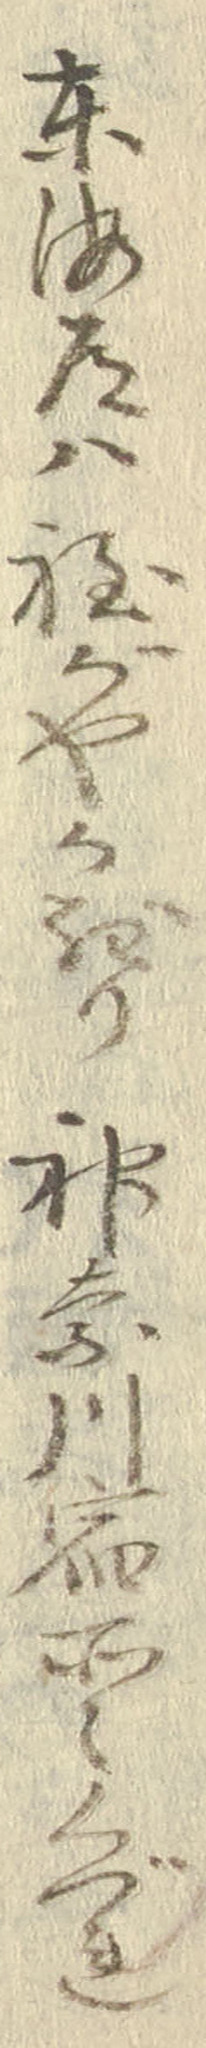東海道ハ程がやかぎり神奈川宿所〻くづれ
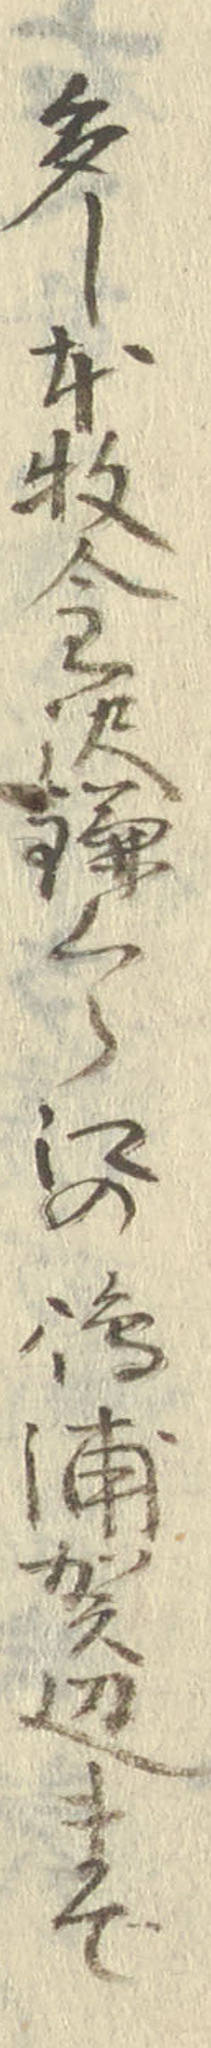多し本牧金沢鎌くら江の嶋浦賀辺まで
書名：御府内御屋敷方市中共地震類焼場所明細書之冩兼街道筋近郷聞書
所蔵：東京大学総合図書館 General Library in the University of Tokyo, JAPAN
